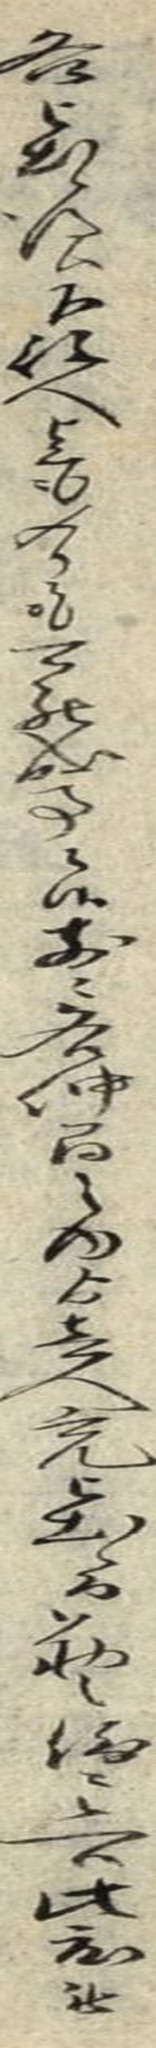各被出候得は下役人迄も〆りも可罷成事に候前々各仲間之内ゟ壱人充被出候而勤候儀に候へは此度被
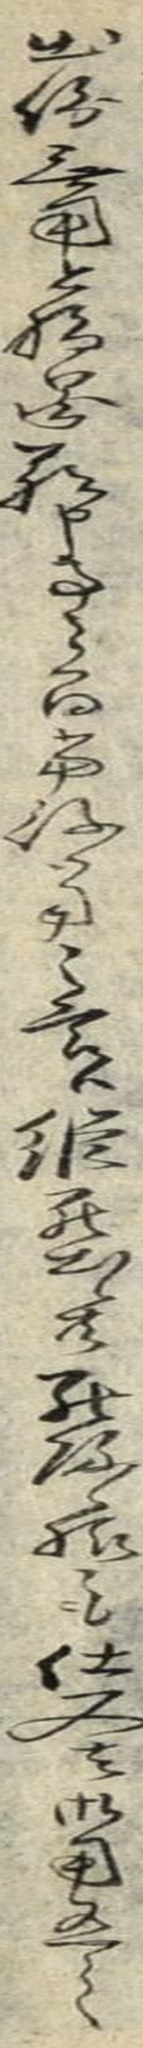出儀無用と指図難申事に候間当役御用之節は縦罷出候様にも仕又ハ御用有之候
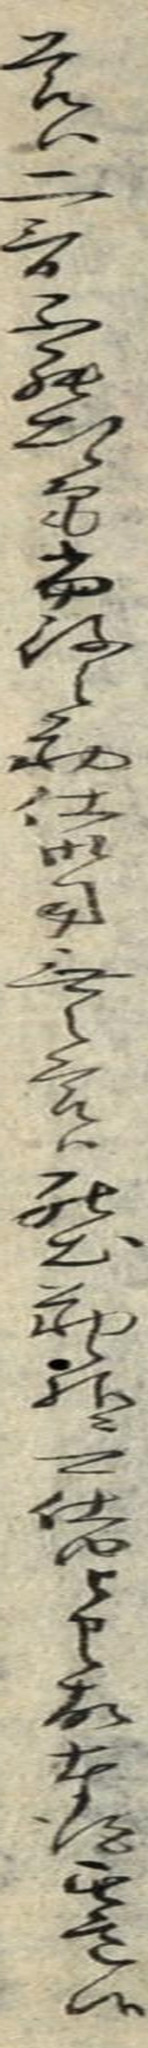節は二三日不罷出候而も当役之勤仕御用無之節は罷出勤候様に可仕候由被申故奉得其意候
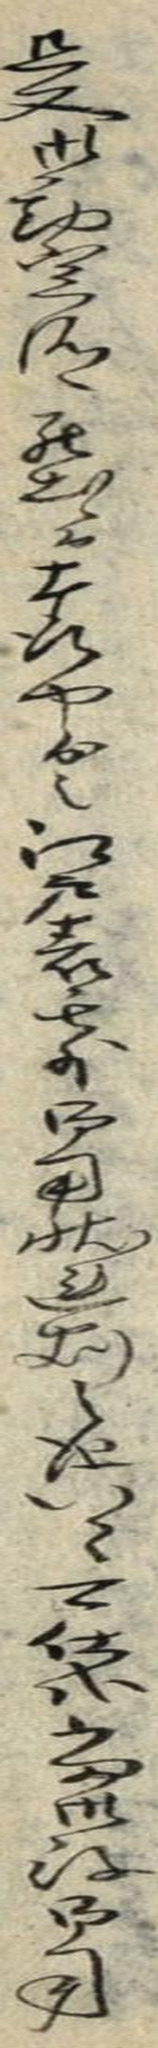且又御勘定所へ罷出候而奉行中ゟ之江戸表其外御用状連判之儀いたし可仕哉当御役御用
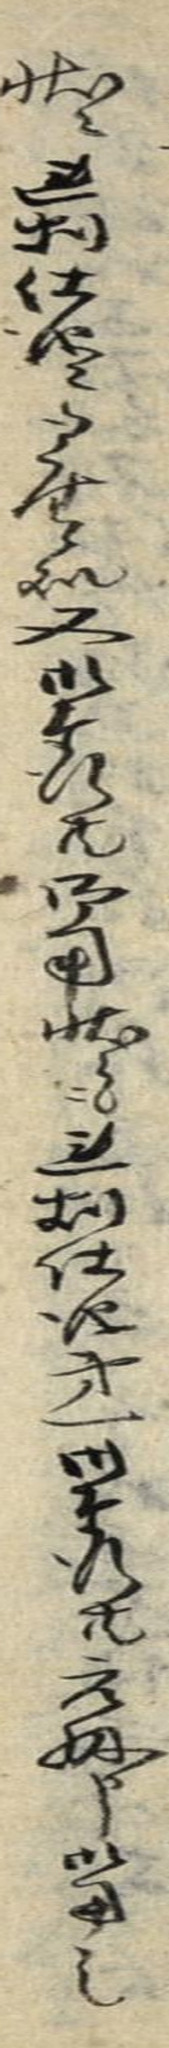状之連判仕儀に御座候処又御奉行共御用状にも連判仕儀第一御奉行共取扱申御用之

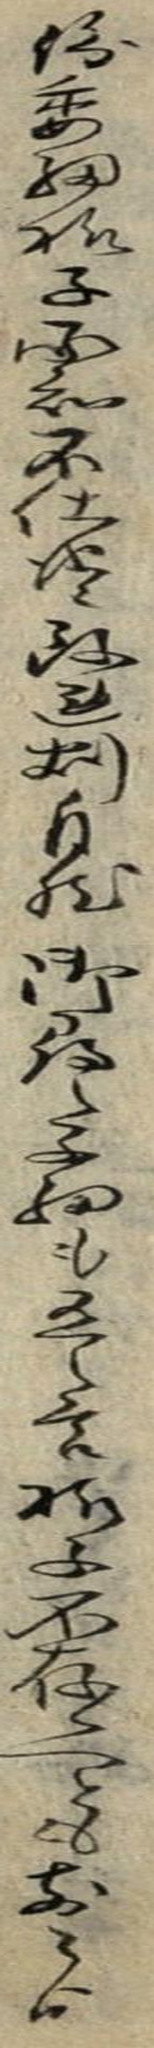儀委細様子承知不仕儀に致連判自然御尋之子細も有之節様子不存候へとも前々ゟ
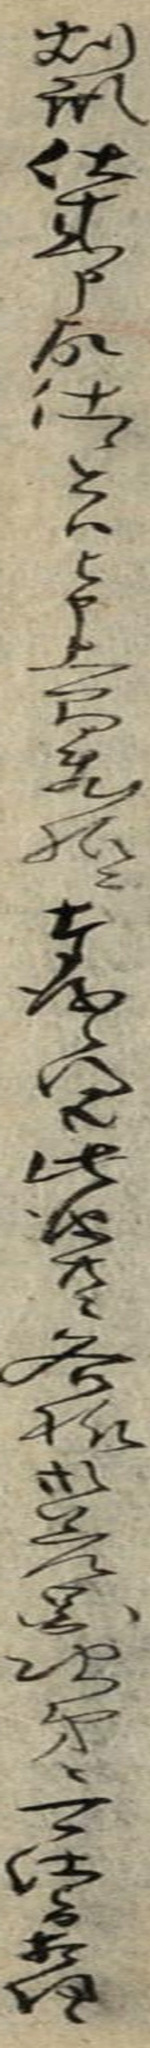判形仕来申故仕候とは被申上間敷候様に奉存候得共此儀共々各様御差図次第に可仕旨相伺候
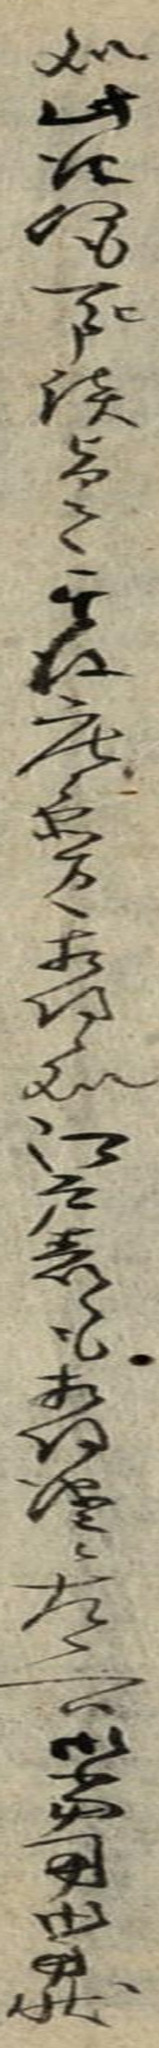処此儀何も可被申談候旨に候其後庄兵衛方へ相伺候処江戸表へも相伺儀に候左候へは御当用御用状
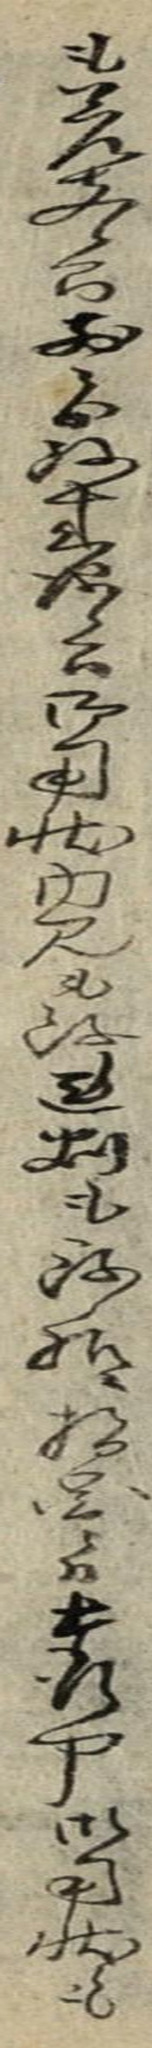も差支候間前々ゟ致来儀侯間御用状内見も致連判も致候様に指図に付奉行中御用状も
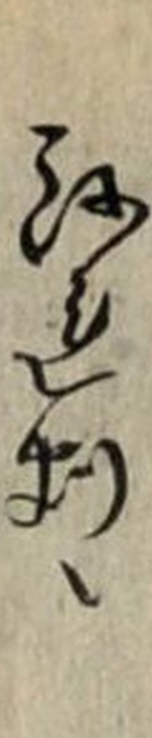致連判候
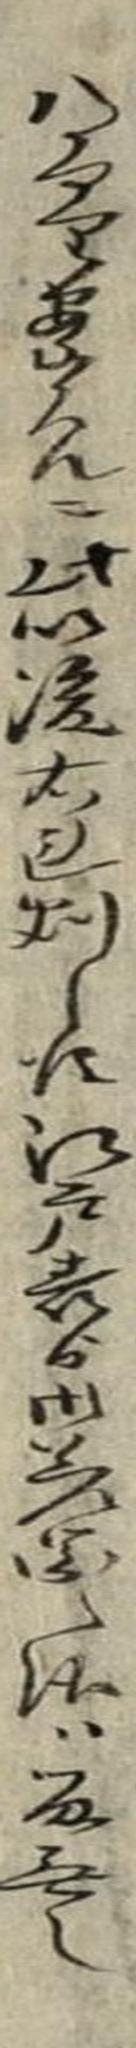八百里案するに此以後右連判之儀江戸表ゟ御差図之儀は留無之
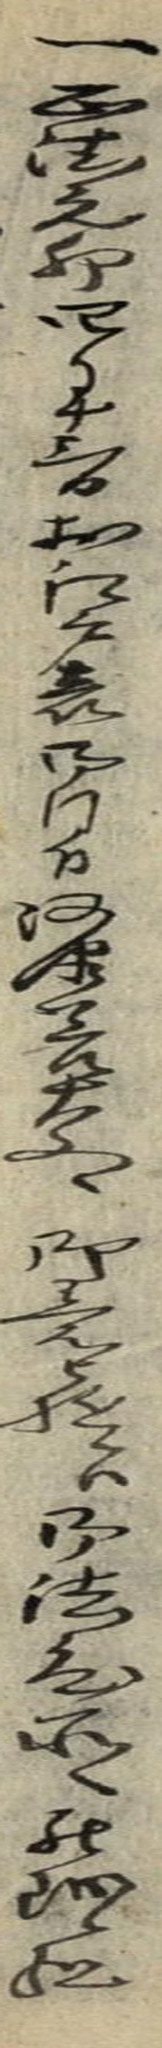一正徳元卯四月十三日於江戸表御目付河津善太夫へ御意被遊候は御法度所へ罷候候組
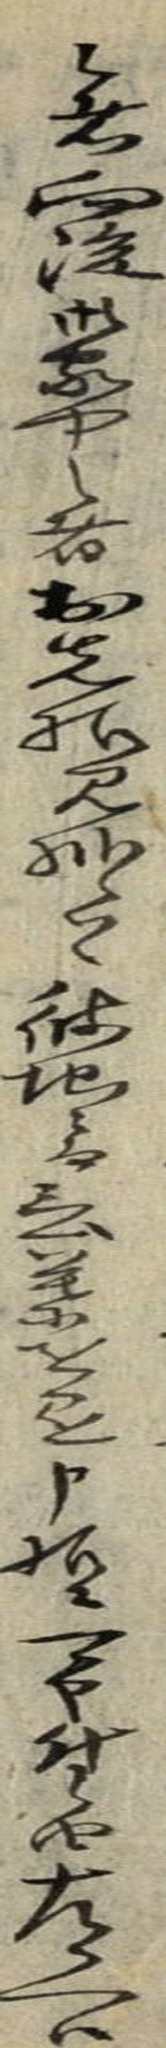之者向後御家中之者於先様見掛候はゝ彼地に而言葉を懸申候様に可申付候由左候へは
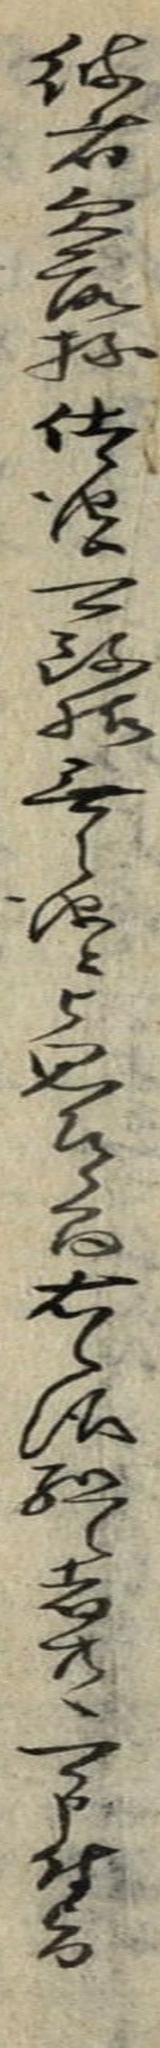彼者欠落抔仕候儀は可致様無之儀に被思召候間右之趣組之者共へ可申付旨
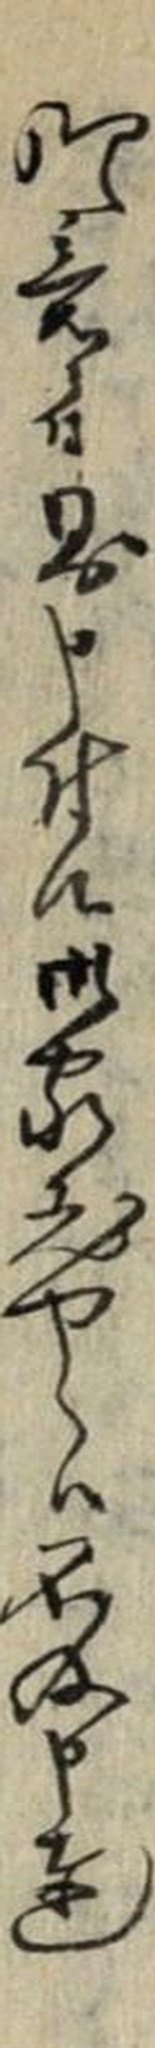御意に付則申付候御家老中へは不及申達
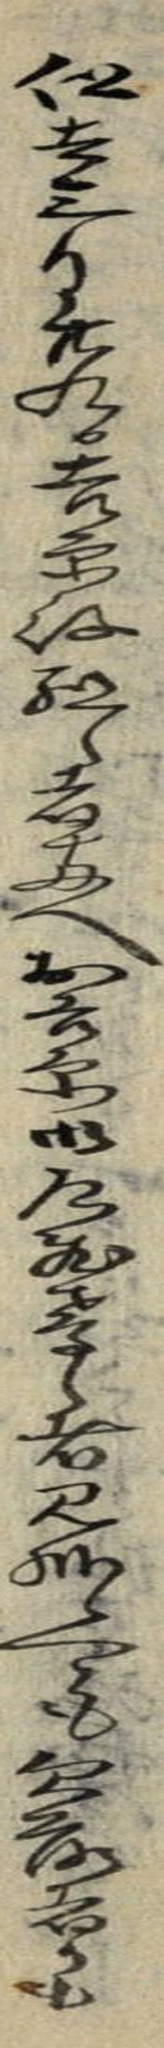但去三月廿九日吉原役組之者両人於吉原御屋敷常？之者見掛候へとも欠落者にも
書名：蒐輯之部
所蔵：福井県文書館 Fukui Prefectural Archives
